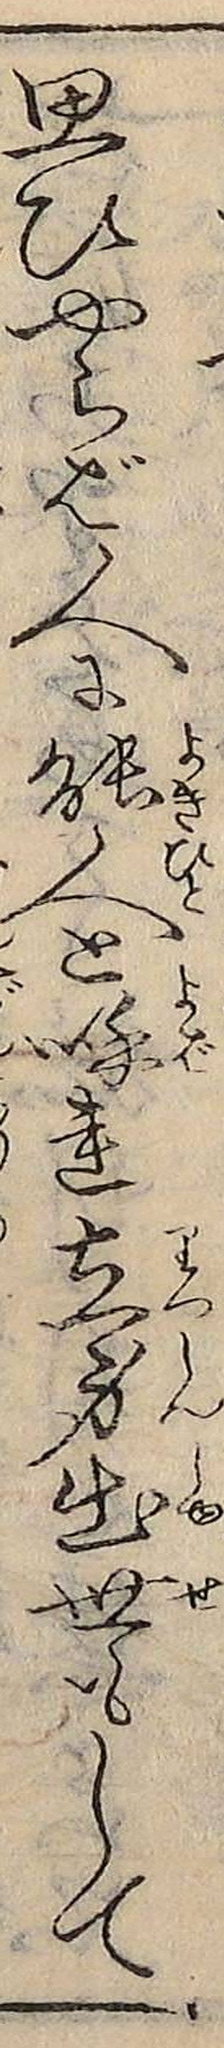思ひやらば人に能人と呼れ立身出世もして
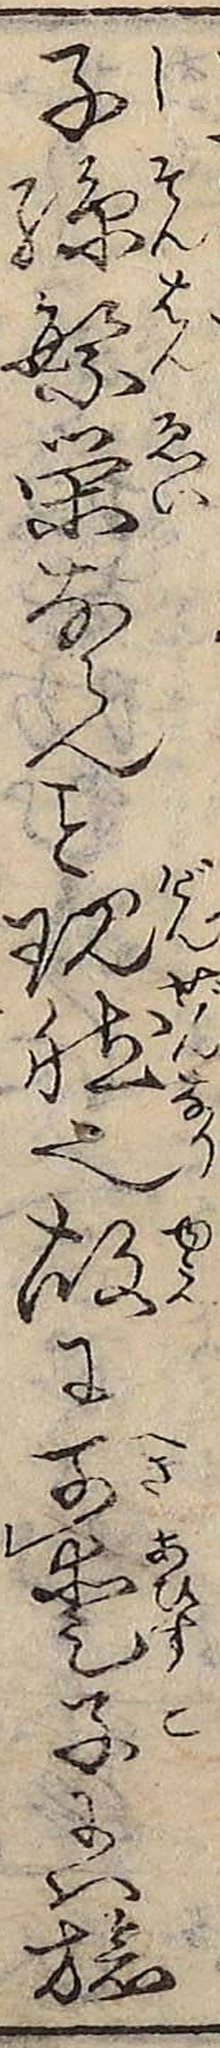子孫繁栄ならんこと現然也故に可愛子には旅
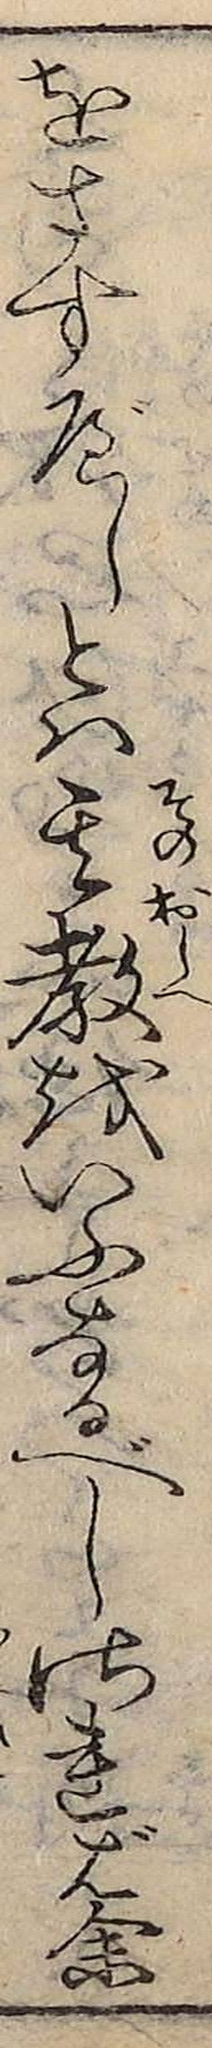をさすべしとは其教をいふなるべしされば余
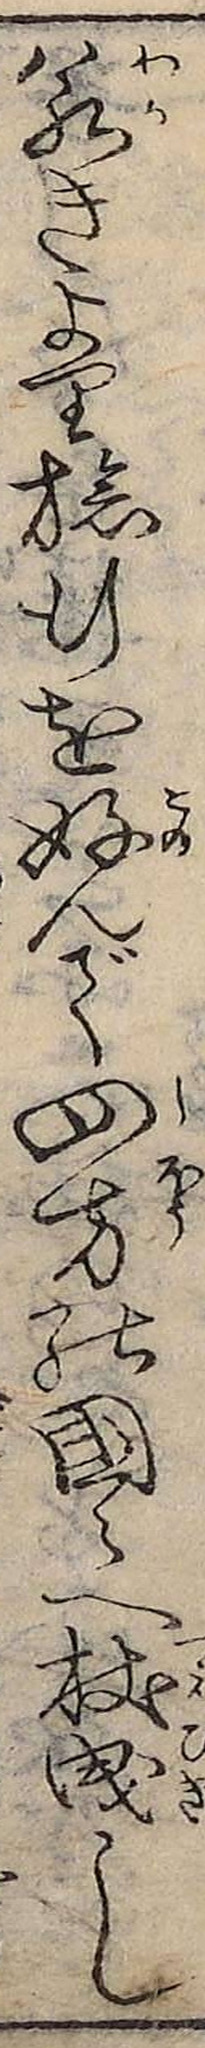若きより旅行を好んで四方の国々へ杖曳し
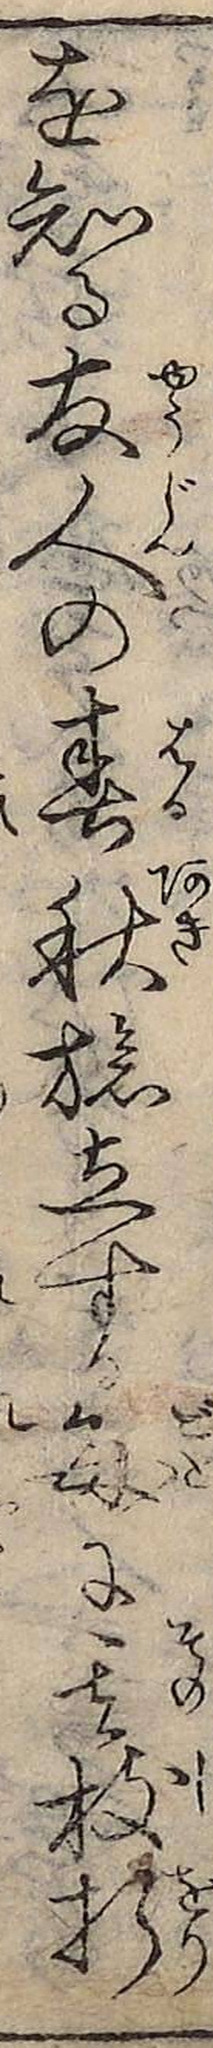を知る友人の春秋旅立する毎に其枝折
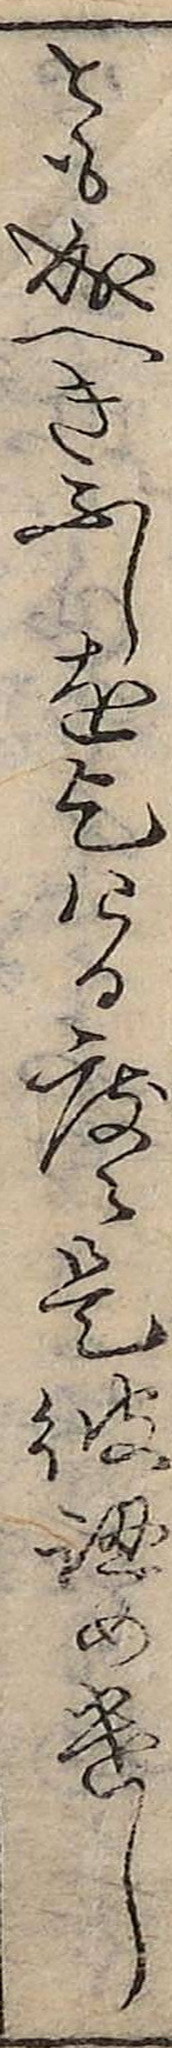とも成へきふしを乞ける度々是彼認め遣し

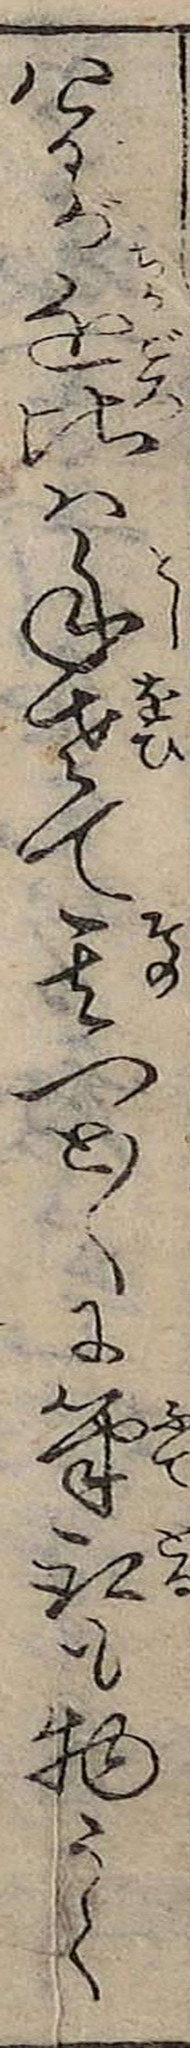けるが近比は年老て其つと〳〵に筆取も物うく
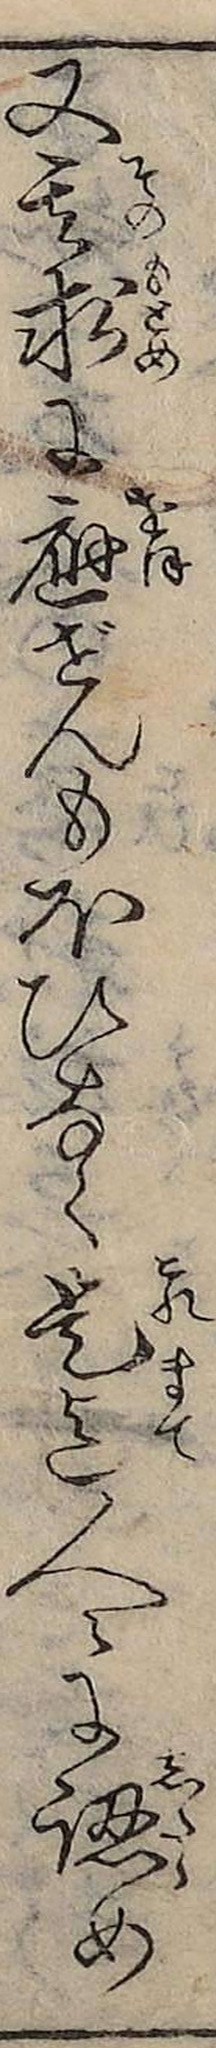又其求に応ぜんもほひなく是迄人々に認め
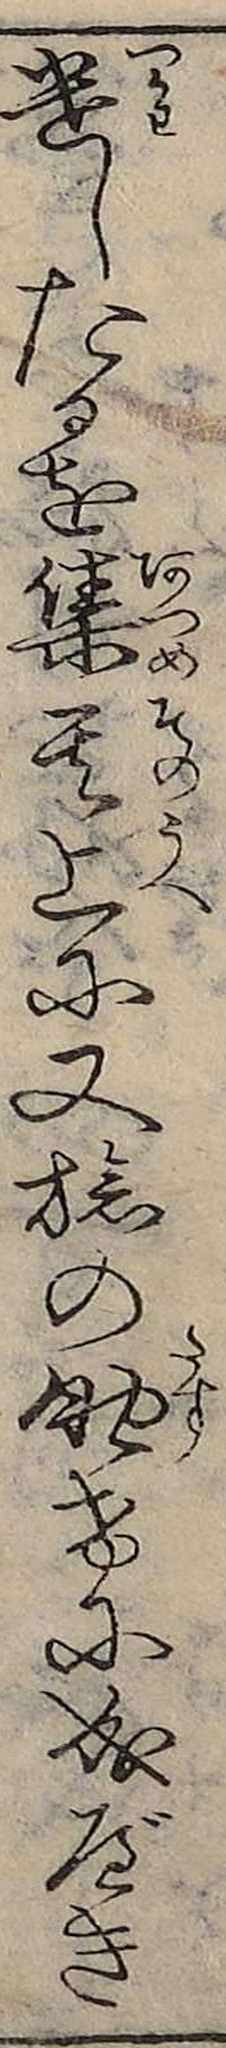遣したるを集其上に又旅の助けに成べき
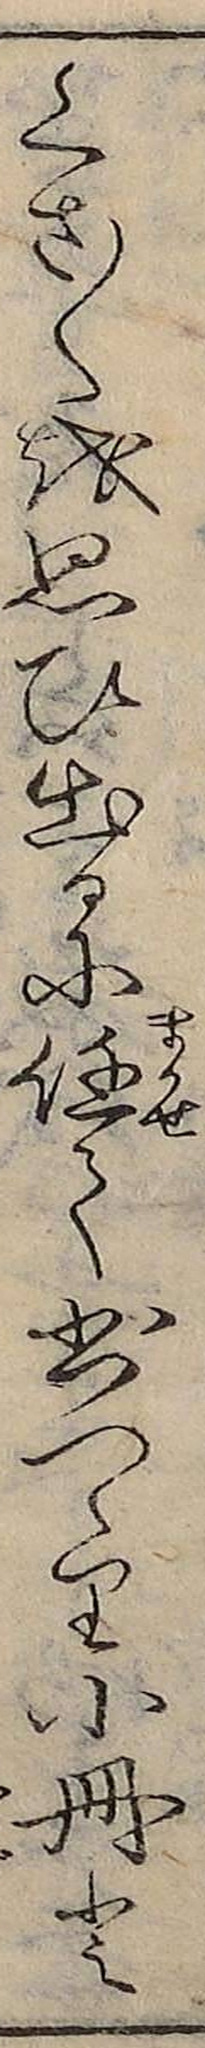くさ〳〵を思ひ出るに任て書つゝり小冊と
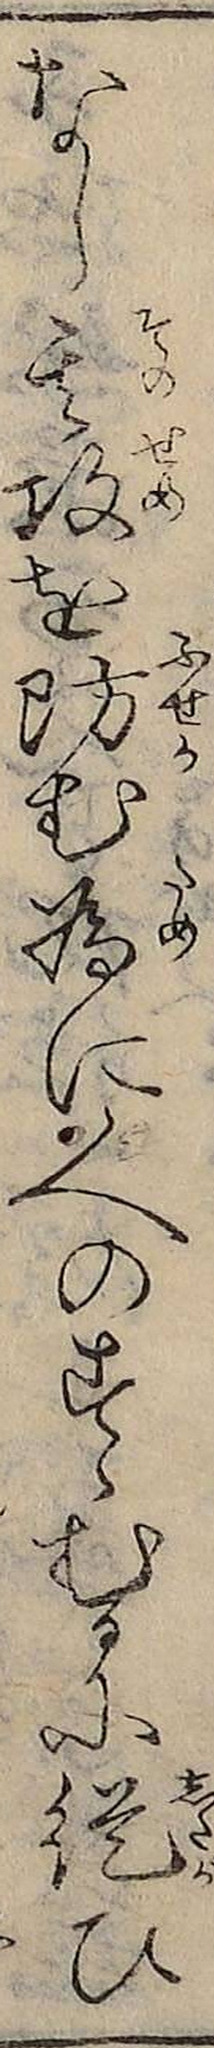なし其攻を防む為に人のすゝむるに従ひ
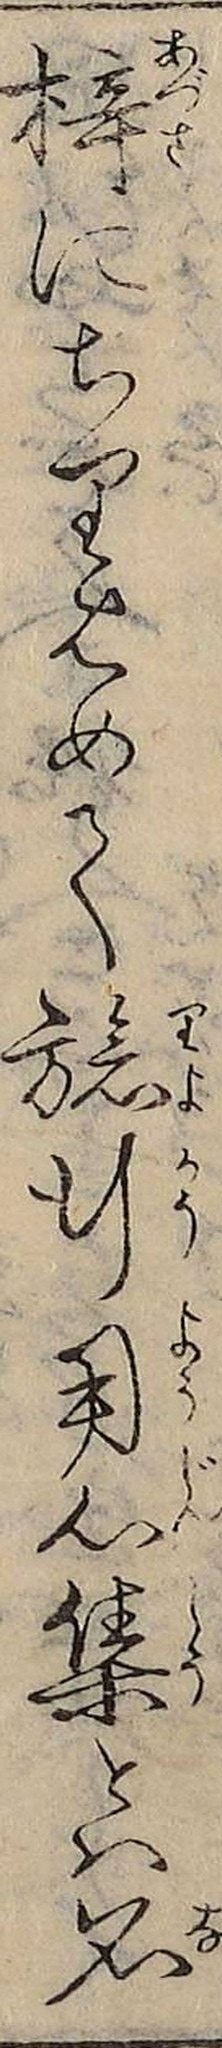梓にちりはめて旅行用心集とは名
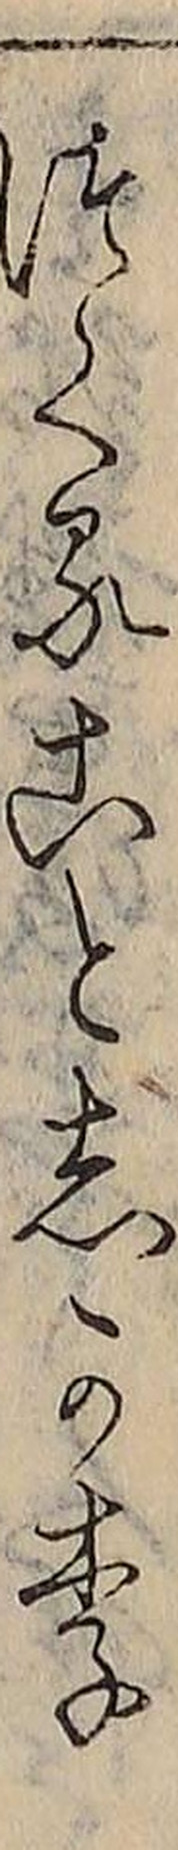つくることしかり
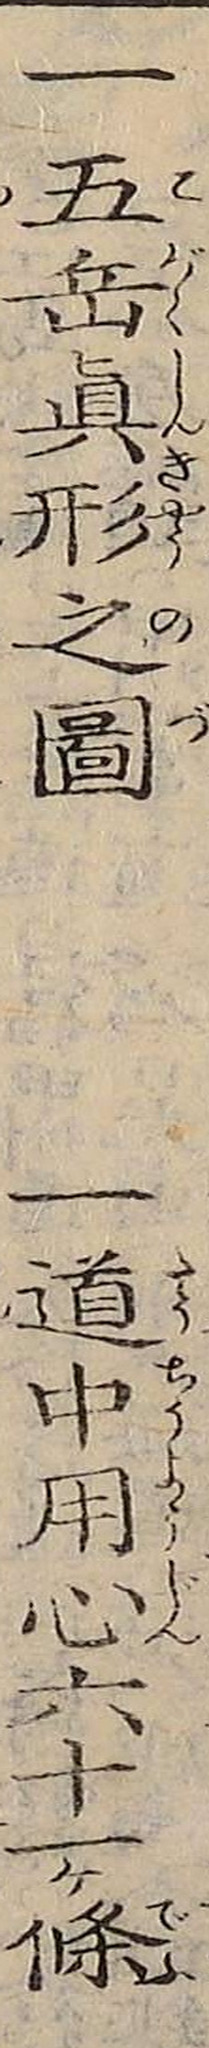一五岳真形之図一道中用心六十一ケ条
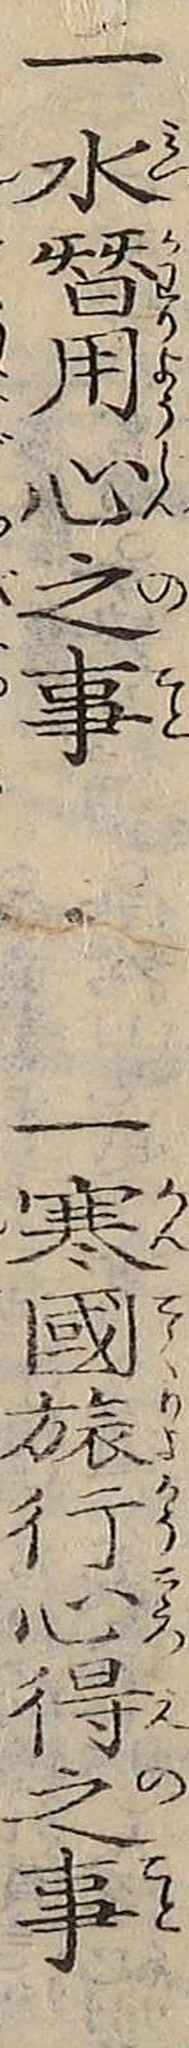一水替用心之事一寒国旅行心得之事
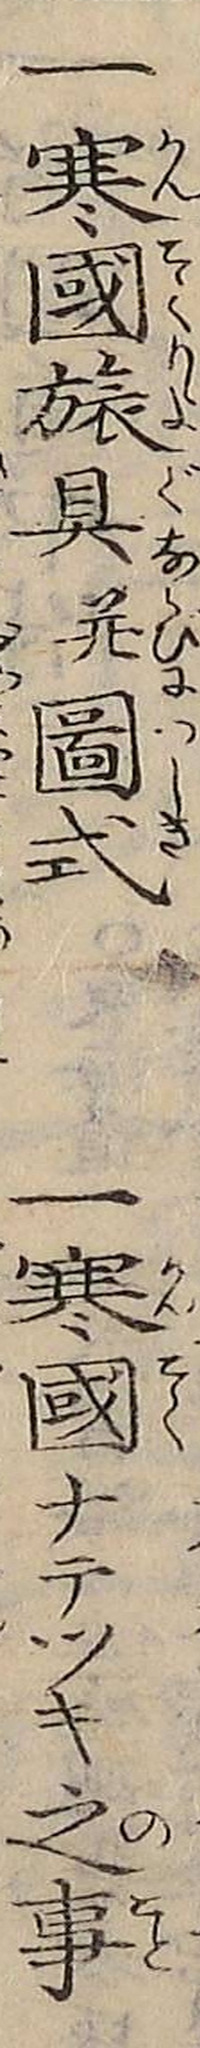一寒国旅具并図式一寒国ナテツキ之事
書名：旅行用心集
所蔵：神戸大学附属図書館 国文学研究資料館
